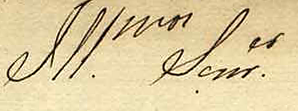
Ill.mos Senr.es
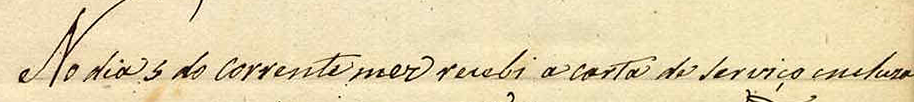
No dia 5 do corrente mez recebi a carta de serviço incluza
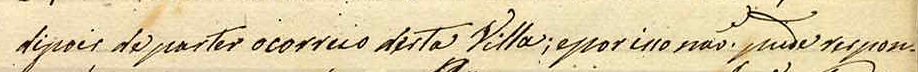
dipois de parter o correio desta Villa; e por isso naõ pude respon
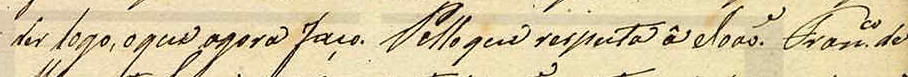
der logo, o que agora faço. Pello que respeita a Ioaõ. Fran.co de
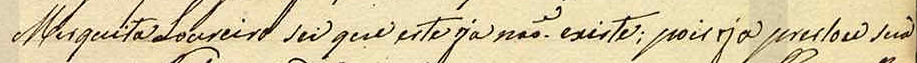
Mesquita Loureiro sei que este ja naõ existe; pois ja prestou sua
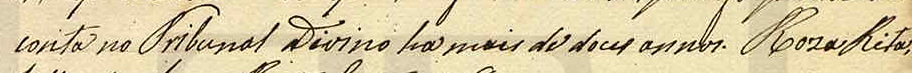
conta no Tribunal Divino ha mais de dous annos. Roza Rita,
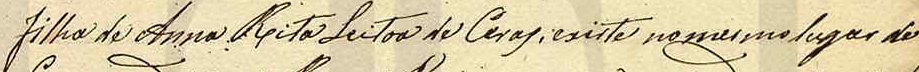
filha de Anna Rita Leitoa de Ceras, existe no mesmo lugar de
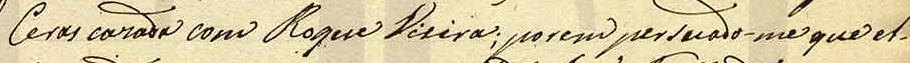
Ceras cazada com Roque Vieira; porem persuado-me que el
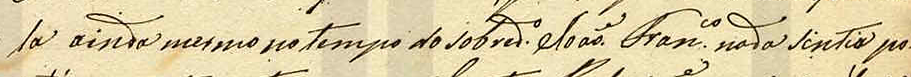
la ainda mesmo no tempo do sobred.o e Ioaõ Fran.co nada sintia po
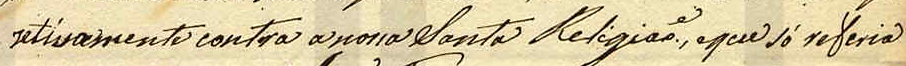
zetivamente contra a nossa Santa Religiaõ, e que só referia
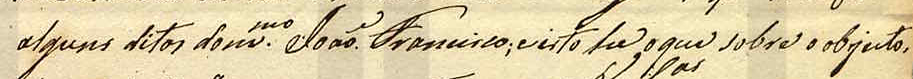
alguns ditos do m.mo Ioaõ Francisco; e isto he, o que sobre o objecto,
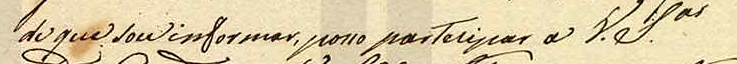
de que sou informar, posso partecipar a V. S.as
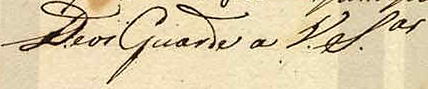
Deos Guarde a V. S.as
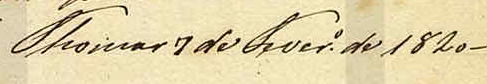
Thomar 7 de Fever.o de 1820
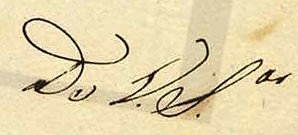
Do V.S.as
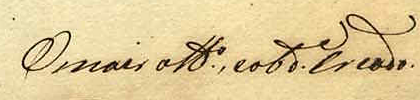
O mais att.o, e obd.e creado.
